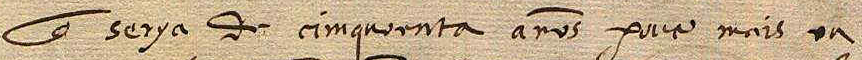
q̄ serya de cimquoenta an̄os pouco mais ou
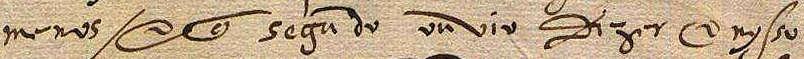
menos / e q̄ segūdo ouvio Dizer e nysso
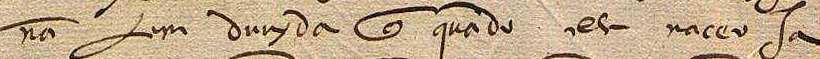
n̄a tem duuyda q̄ qūado elle naceo Ja
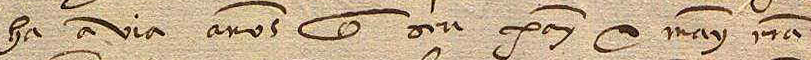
ha avia anos q̄ seu pāy e mãy er̄a
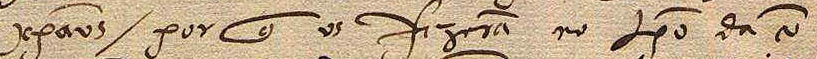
xpãoāos / por q̄ os fizerā no tp̄o d̄acō
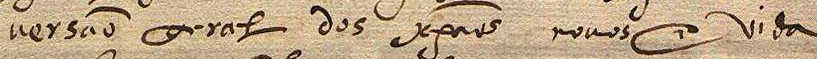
uersão geral dos xpãoaos uovos ē vida
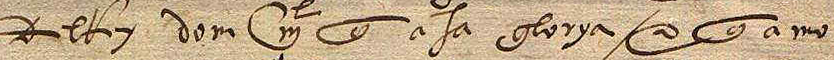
del Rey dom mel q̄ aJa glorya / e q̄ a mo
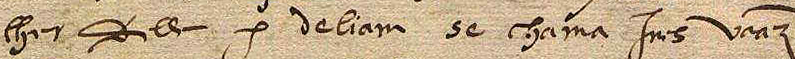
lher delle po de liam se chama Jnes vāaz
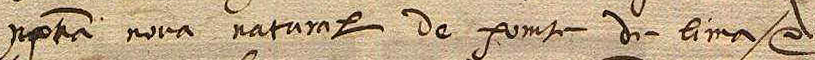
xpāa noua naturaL de pomte de lima / e
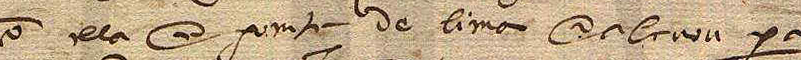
c̄o ella ē pomte de lima e a levou ꝑa
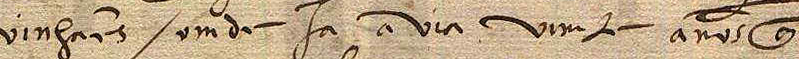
vinhaēs / omde Ja avia vimte an̄os q̄
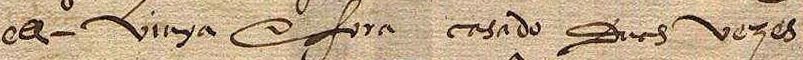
elle viuya e fora casado Duas vezes
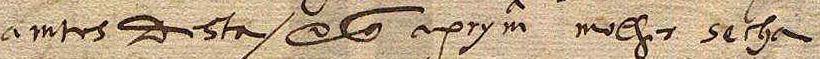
amtes Desta / e q̄ a pryma molher se cha
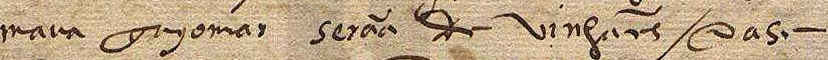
maua guyomar serāa de vinhaēs / e a se
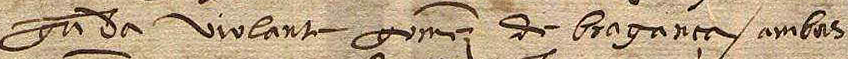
ḡuda violante gom̄ez de bragança / ambas
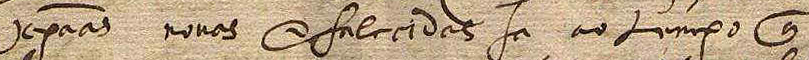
xp̄aas nouas e falecidas Ja ao tempo q̄
